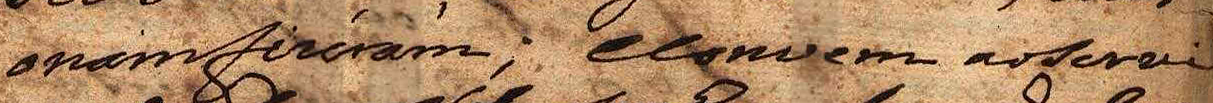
o nam fizeram; e convem ao servi
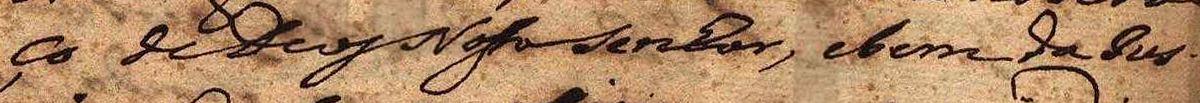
ço de Deos Nosso senhor, e bem da Ius
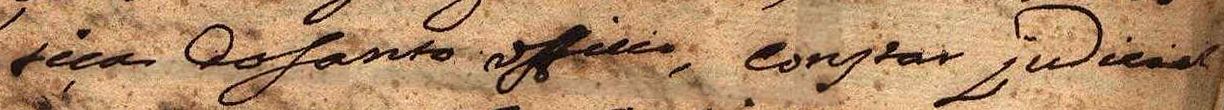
tiça do santo officio, constar judicial
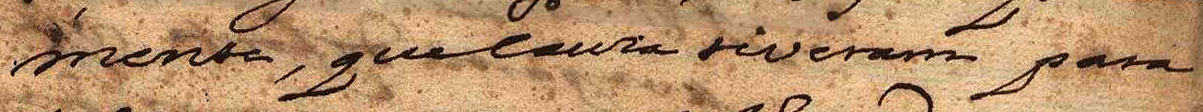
mente, que cauza tiveram para
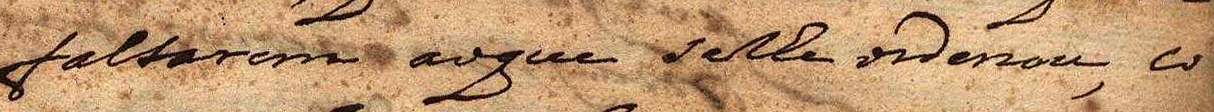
faltarem ao que se lhe ordenou, co
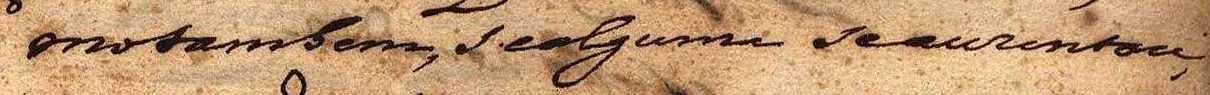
mo tambem, se alguma se auzentou,
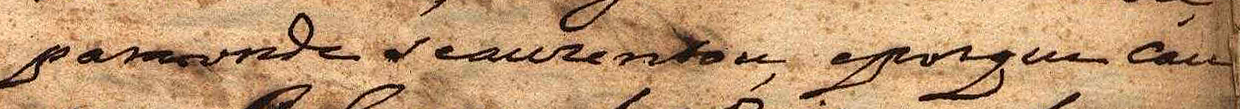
para onde se auzentou, e porque cau
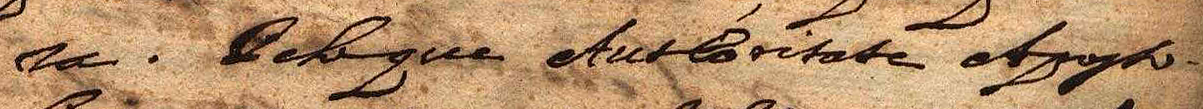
za. Pelo que Authoritate Aposto
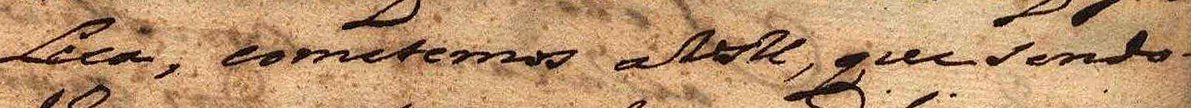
Lica, cometemos a V M, que sendo
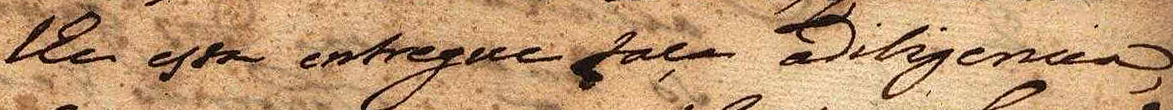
lhe esta entregue faça a diligencia,
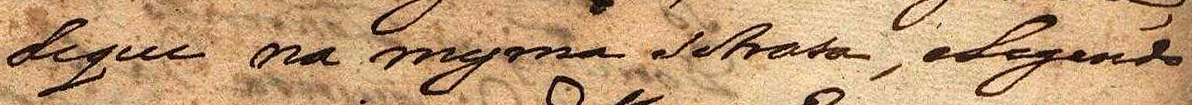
de que na mesma se trata, eLegendo
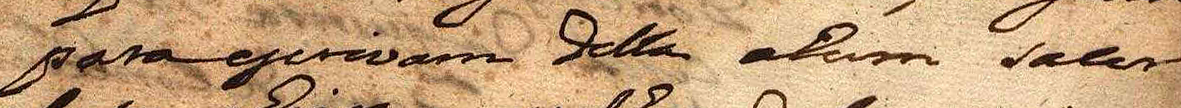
para escrivam della a hum sacer
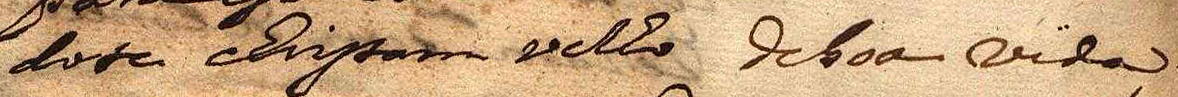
dote christam velho de boa vida,
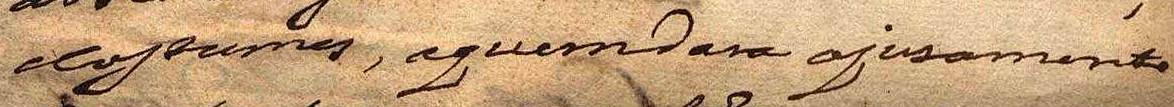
e costumes, a quem dara o juramento
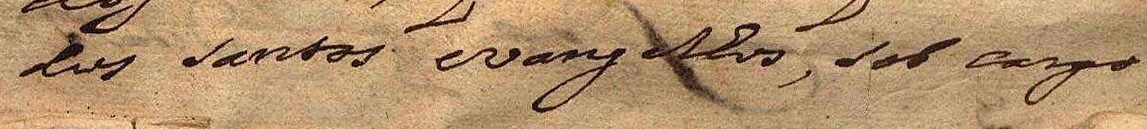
dos santos evangelhos, sob cargo
